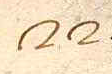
22.
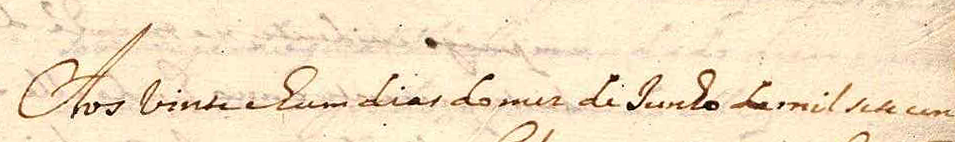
Aos vinte e hum dias do mez de Iunho de mil setecen
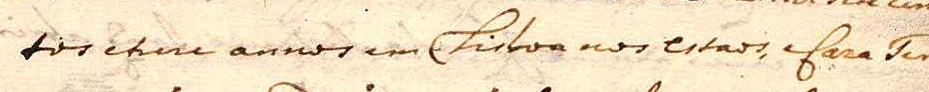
tos e treze annos em Lisboa nos estaos, e Caza Ter
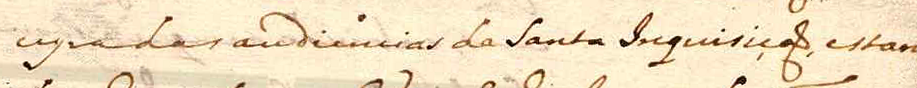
ceyra das audiencias da Santa Inquisiçaõ, estan
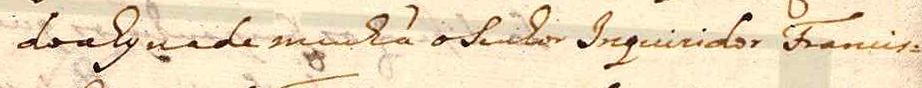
do ahy na de menhã o Senhor Inquizidor Francis
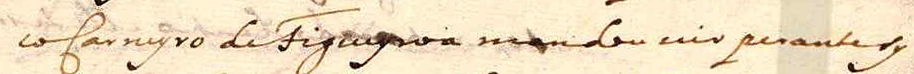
co Carneyro de Figueyroa mandou uir perante sy
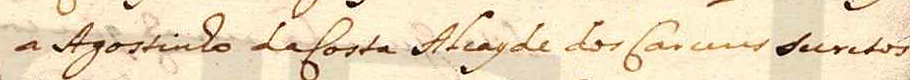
a Agostinho da Costa Alcayde dos Carceres secretos
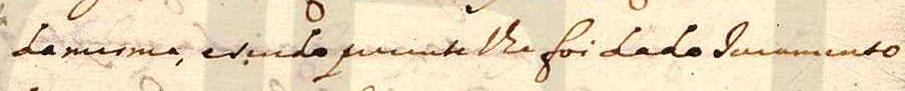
da mesma, e sendo prezente lhe foi dado Iuramento
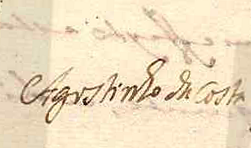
Agostinho da Costa
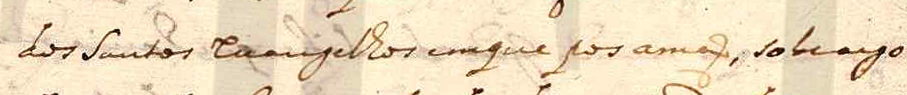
dos Santos Euangelhos em que pos a maõ, sob cargo
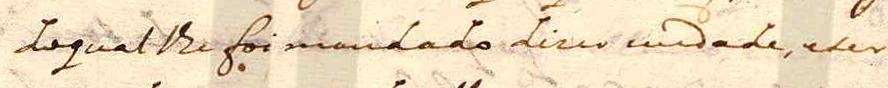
do qual lhe foi mandado dizer uerdade, e ter
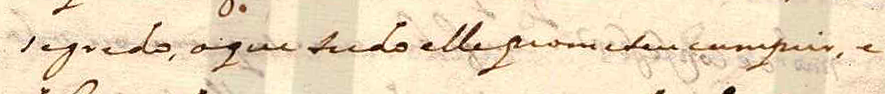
segredo, o que tudo elle prometeu cumprir, e
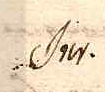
Iur.
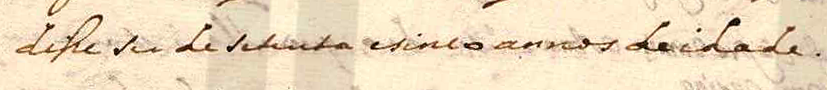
disse ser de setenta e sinco annos de idade.
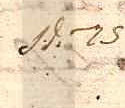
Id. 75
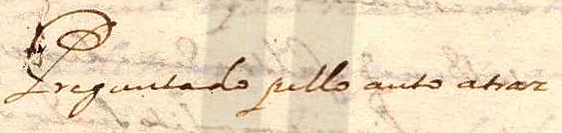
Preguntado pello auto atraz
